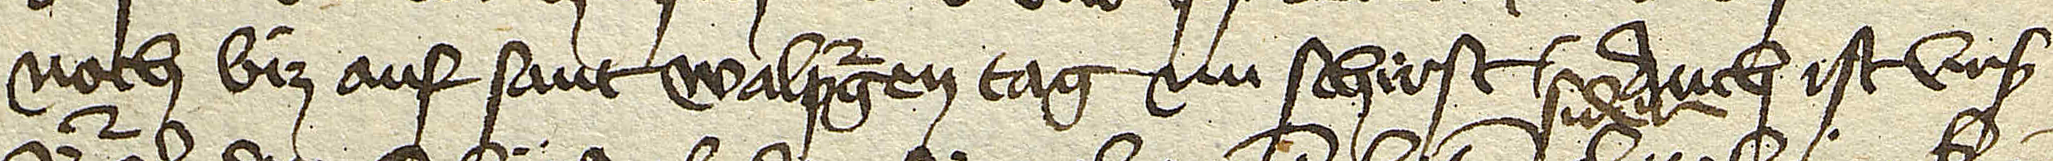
noch biʒ auf ſant walp*gen tag nu ſchirſt / Auch iſt vnſ*
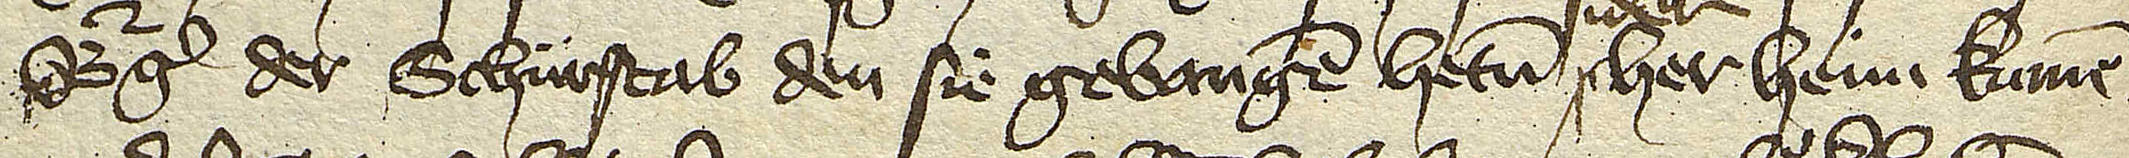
B*g* der Schürſtab den ſie gevange* hetn* her heim kume*
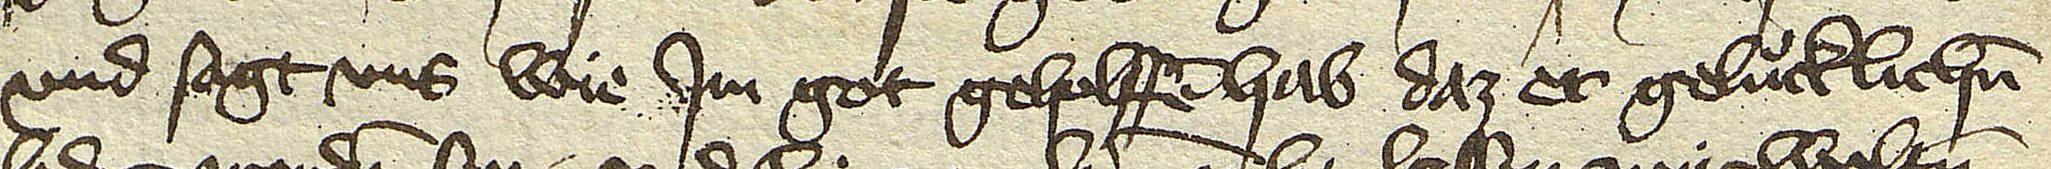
vnd ſagt vns wie Im got geholffe* hab daʒ er gelücklichn*
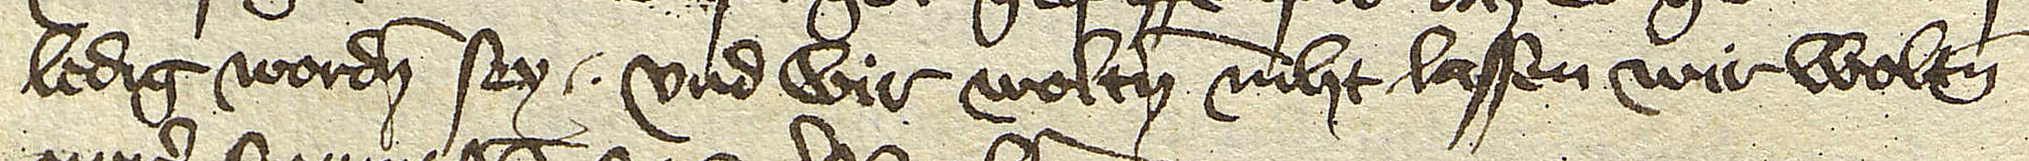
ledig wordn* ſey / . vnd wie woltn* niht laſſen wir woltn*
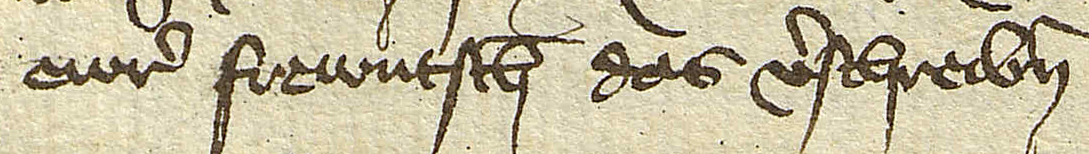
ewr* frewntſch* das v*ſchreibn*
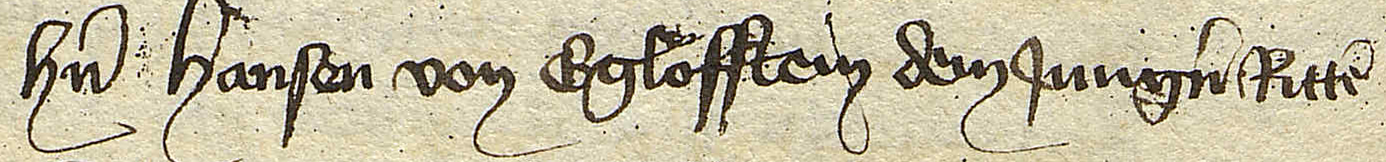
hn* hanſen von Eglofſtein dem Iungn* Ritte*
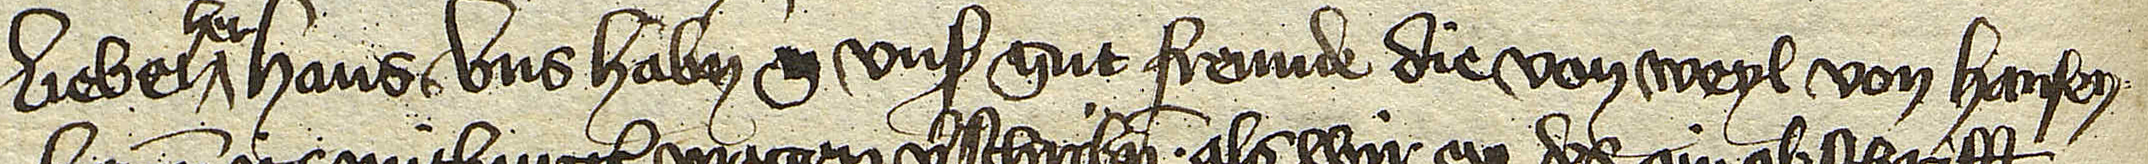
Lieber hans / Vns habn* g vnſ* gut freunde die von weyl von hanſen
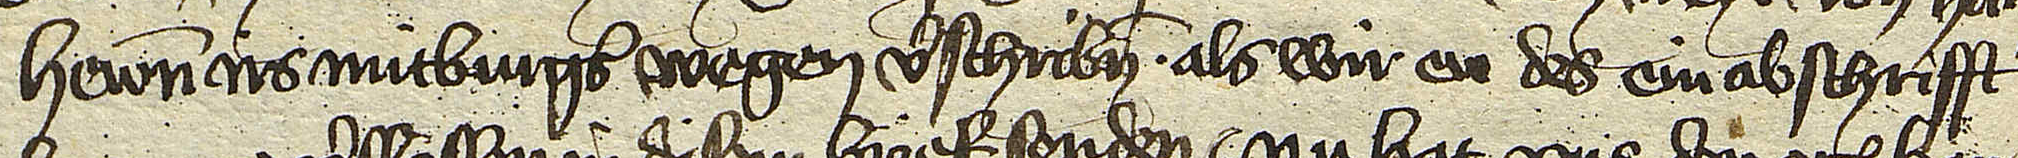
hewn* irs mitburgs* wegen v*ſchribn* als wir ew des ein abſchrifft
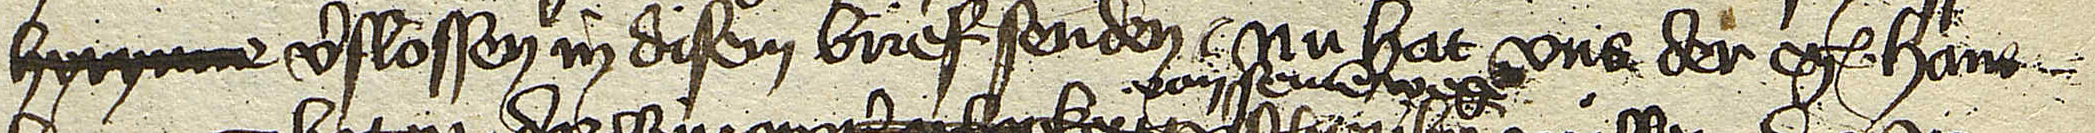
hyrynne v*ſloſſen in diſem brief ſenden / Nu hat vns der eg* hans
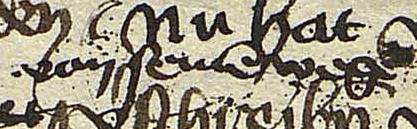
von ſeine* wege*
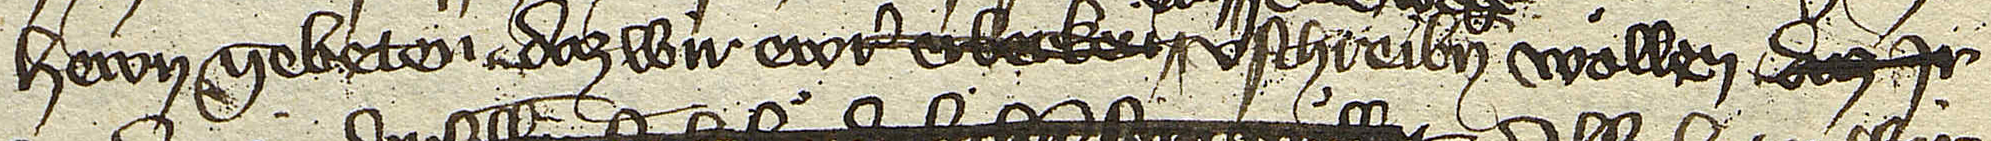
hewn gebeten / daʒ wir ewr* erberkeit v*ſchreibn* wöllen / daʒ Ir
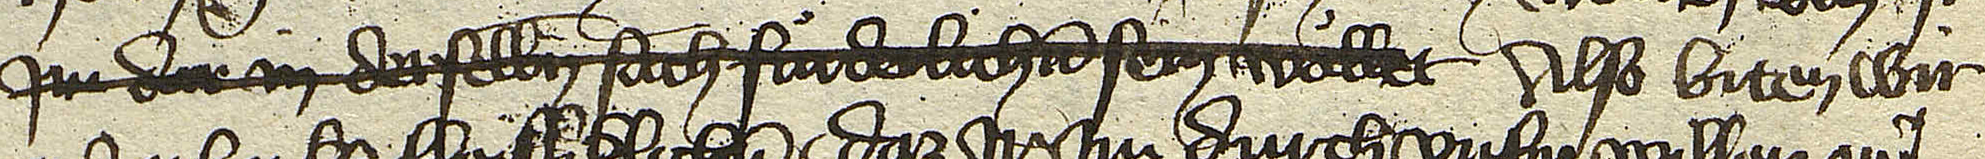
Im dar in derſelbn* ſach fürderlichn* ſein wöllet Alſo biten wir
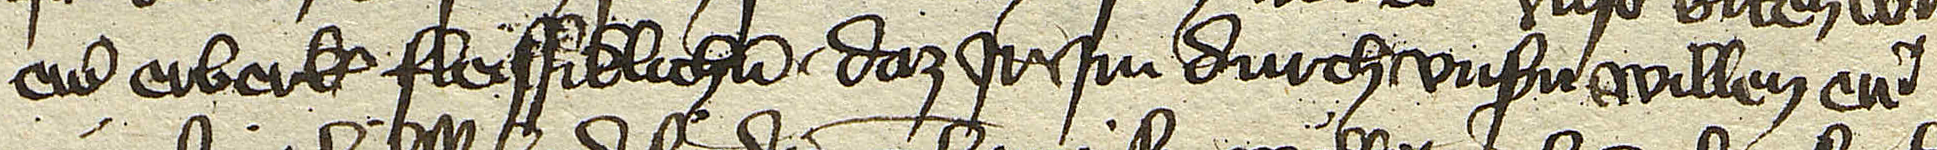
ew* erberk* fleiſſiklichn* / daʒ Ir Im durch vnſ*n wollen ew*
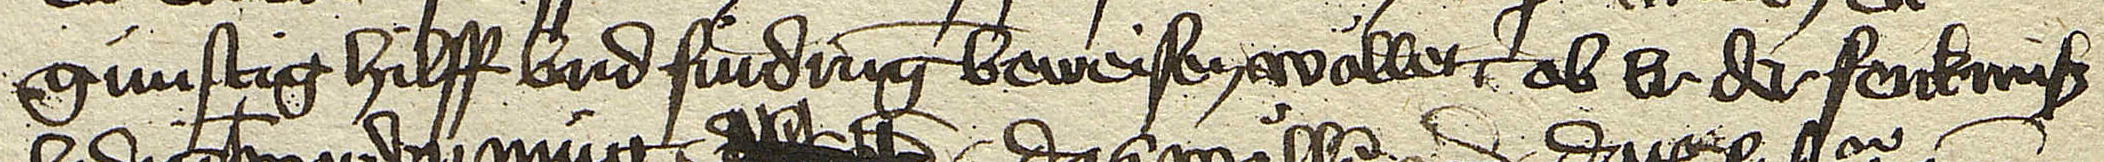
günſtig hilff vnd fürdrug* beweiſen wöllet / ob Er der fenknuſʒ
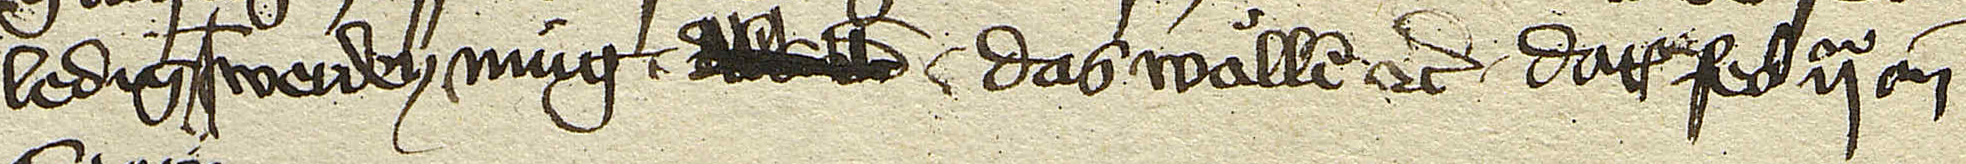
ledig werden müg / Als ec* / das wölle* ec* / dat* fea* ii* an*
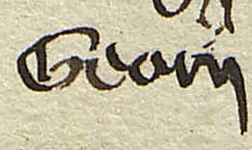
Georii
